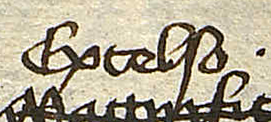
Excelſo
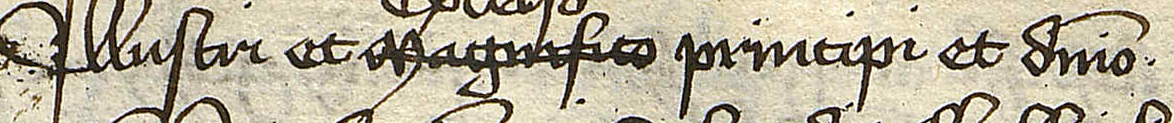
Illuſtri et Magnifico principi et d*nio
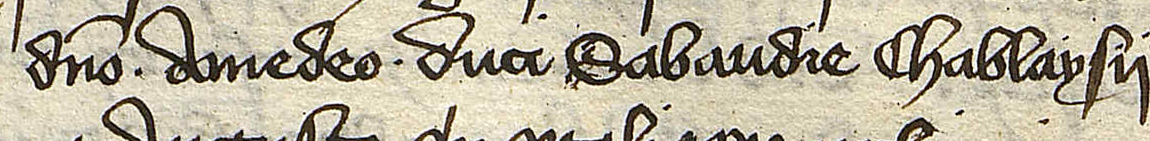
d*no . Amedeo . duci Sabaudie Chablaysii
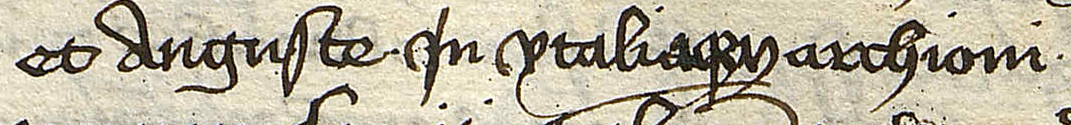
et Anguſte in Ytaliaq* Marchioni
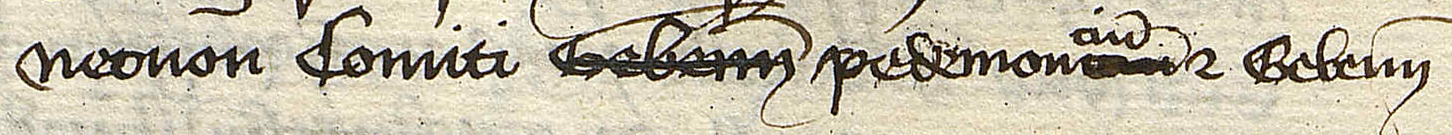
necnon Comiti Gebenn* Pedemon%%%ciu* @ Gebenn*
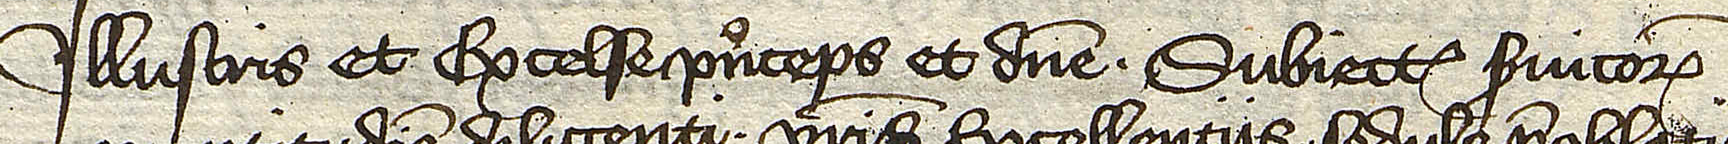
Illuſtris et Excelſe p*nceps et d*ne . Subiect* ſ*uico*
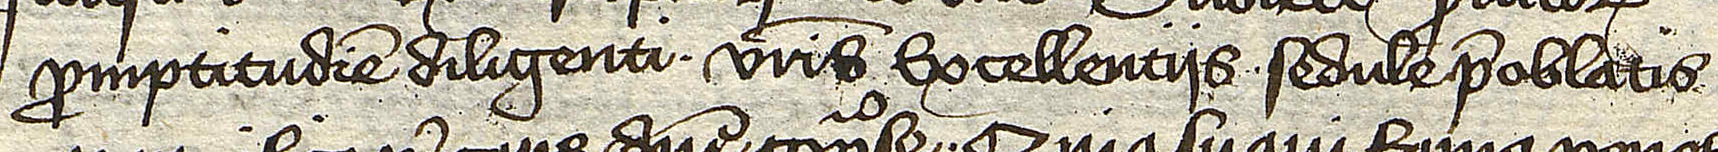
p*mptitudi*e diligenti . v*ris Exellenciis ſedule p*oblatis
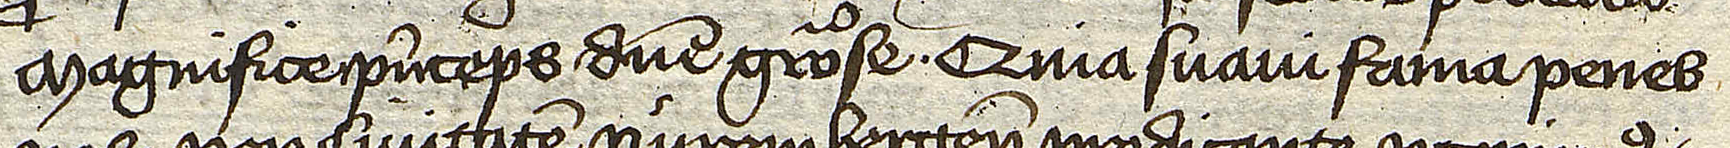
Magnifice p*nceps / d*ne g*roſo . Quia ſuaui fama penes
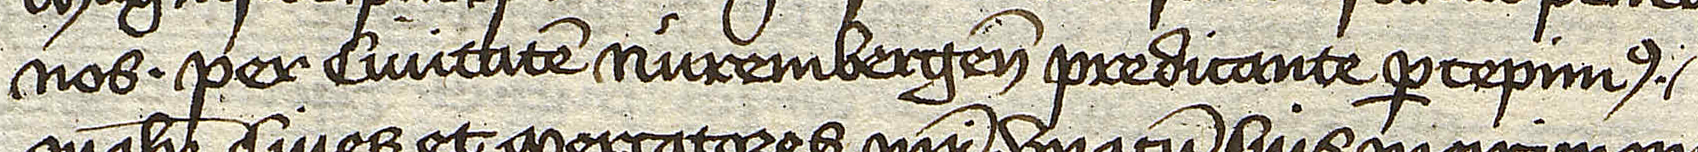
nos . per Ciuitate* Nürembergen* predicante p*cepim* . /
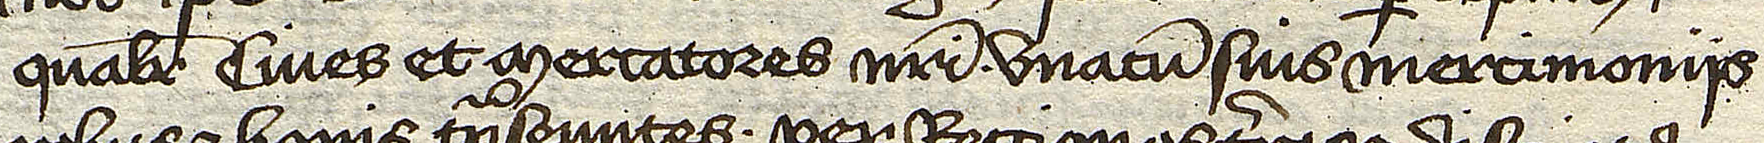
qual*r Ciues et Mercatores n*ri . vnacu* ſuis mercimoniis
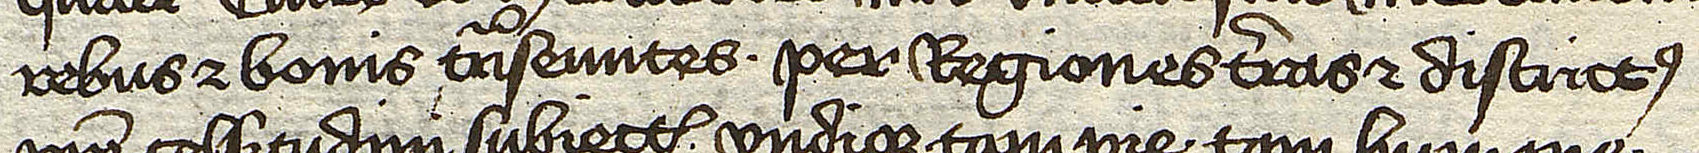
rebus @ bonis tri*ſeuntes . per Regiones t*ras @ diſtrict*
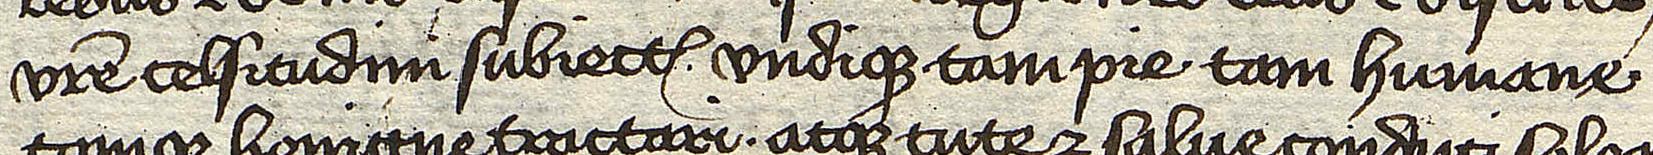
v*re celſitudini ſubiect* . vndiq* tam pie . tam humane
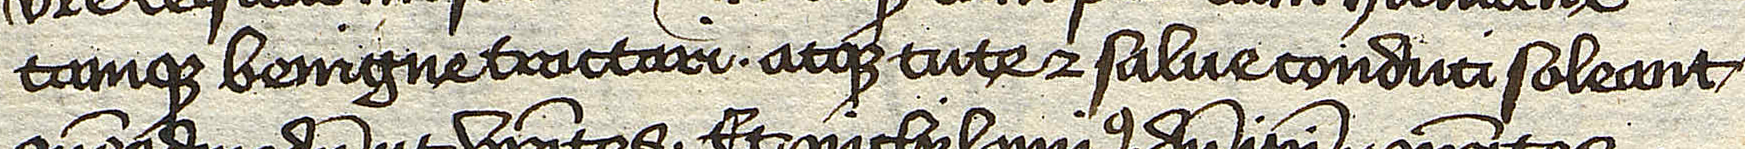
tamq* benigne tractari . atq* tute @ ſalue conduci ſoleant /
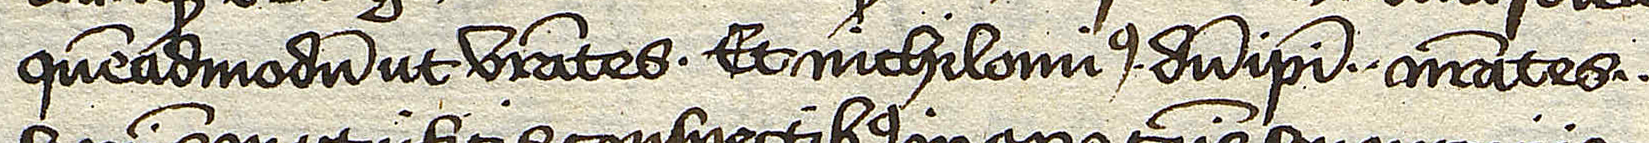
Que*admodu* ut v*rates . Et nichilomi* . du* ip*i . n*rates . .
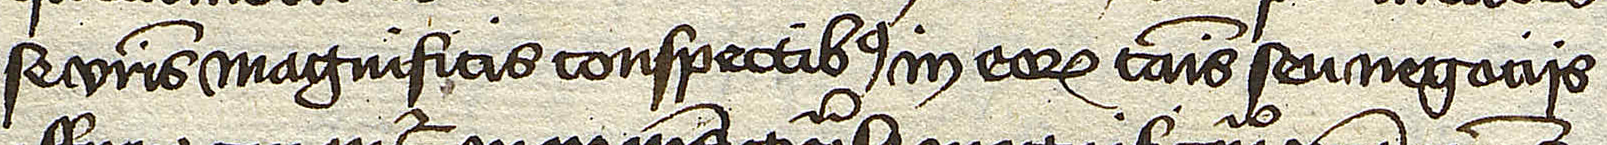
ſe v*ris magnificis conſpectib* in eo* ca*is ſeu negociis
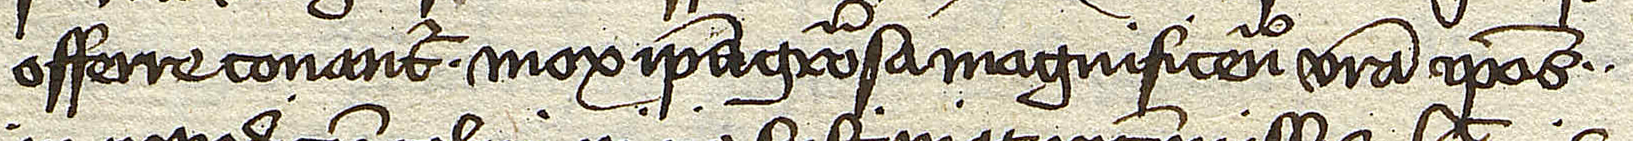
offerre conant* . mox ip*a g*roſa magnificenc* v*ra ip*os . .
